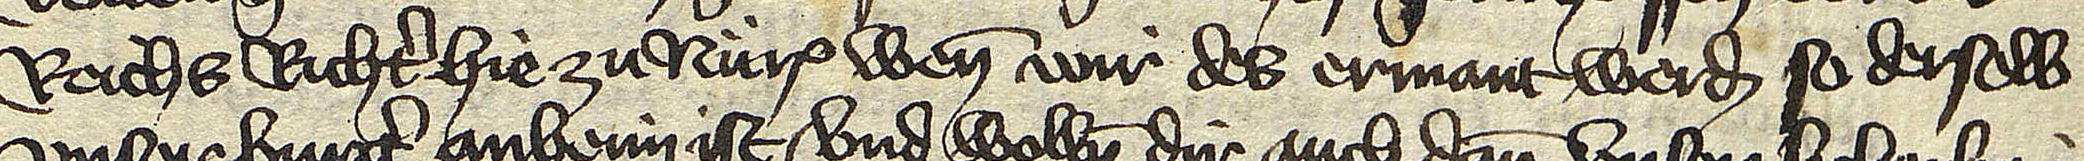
Reichs Richt* cʒu Nür* wen* wir des ermant werd* ſo derſelb
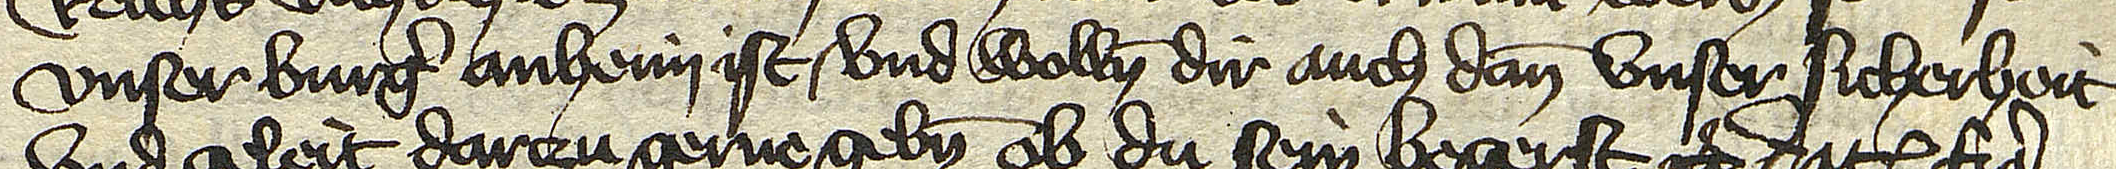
vnſer burg* anheim iſt / vnd wolln* dir auch dan* vnſer ſicherheit
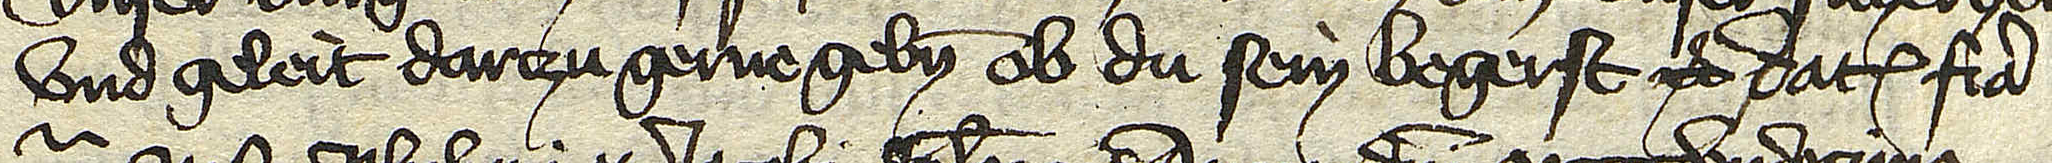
vnd geleit darcʒu gerne gebn* ob du ſein begerſt ec* dat* fia*
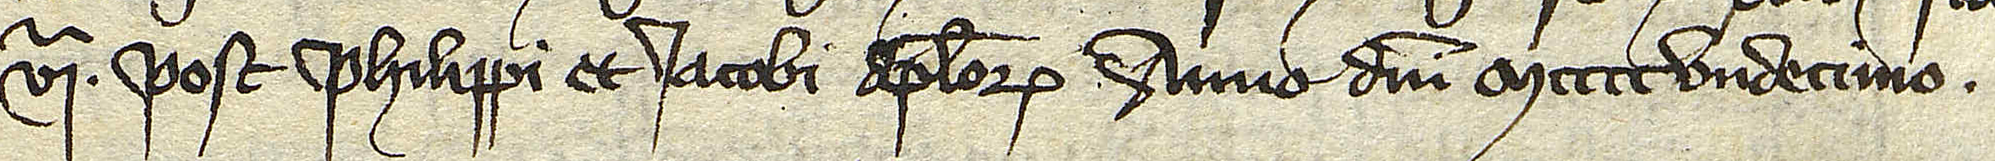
vi* . poſt Philippi et Iacobi Aplo* Anno dni* Mcccc vndecimo .
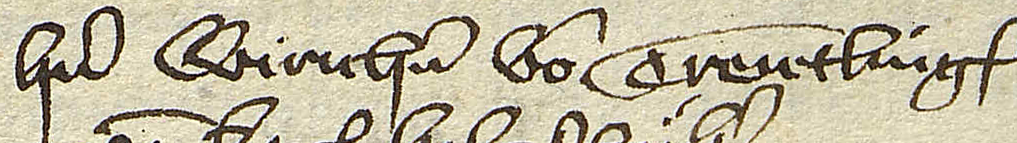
hn* wirichn* vo* Trewtling*
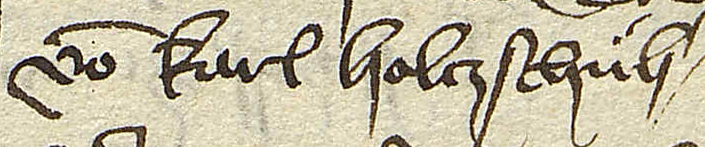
vo* Karl holcʒſchüh*
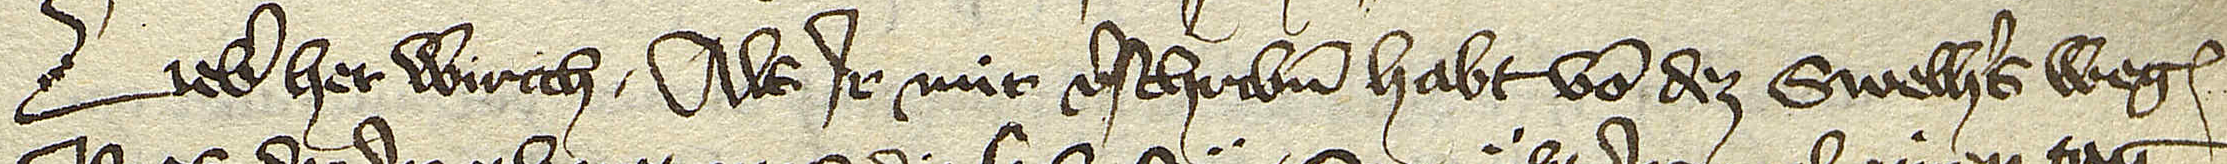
Lieb* her Wirich / Als Ir mir v*ſchribn* habt vo* deʒ Swelh*s weg*
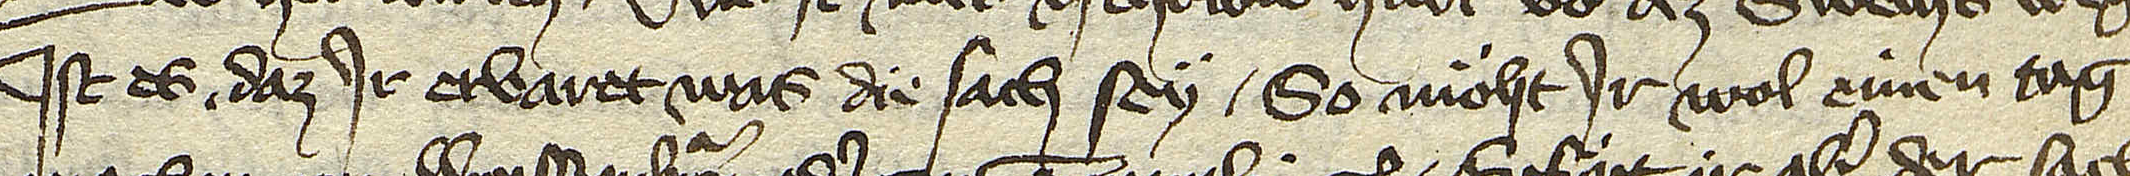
Iſt es / daʒ Ir ervaret was die ſach ſey / So möht Ir wol einen tag
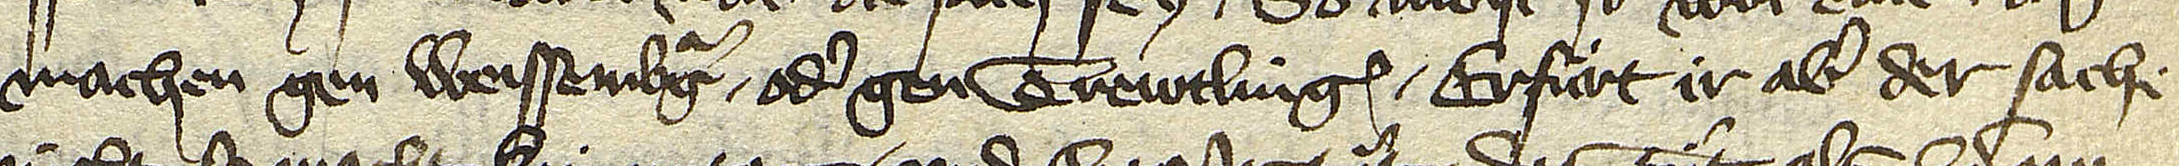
machen gen Weiſſemb*g / od* gen Trewtling* / Erfürt it ab* der ſache
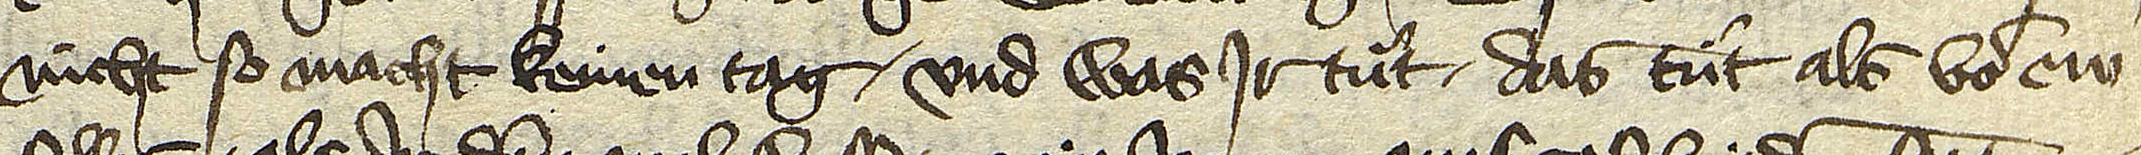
nicht ſo macht keinen tag / vnd was Ir tüt / das tüt als vo* ew
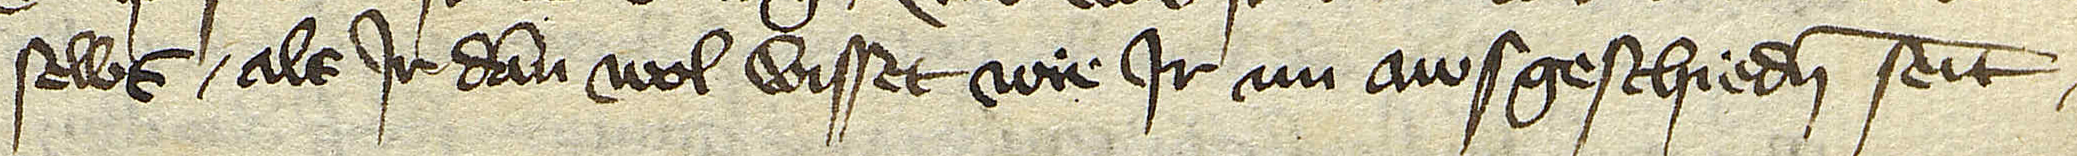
ſelbs / als Ir dan* wol wiſſet wie Ir nu awſgeſchiedn* ſeit /
